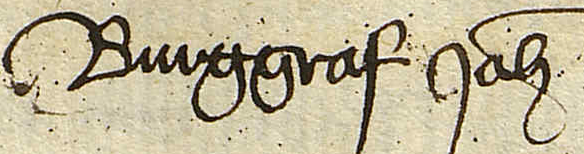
Burggraf Ioh*
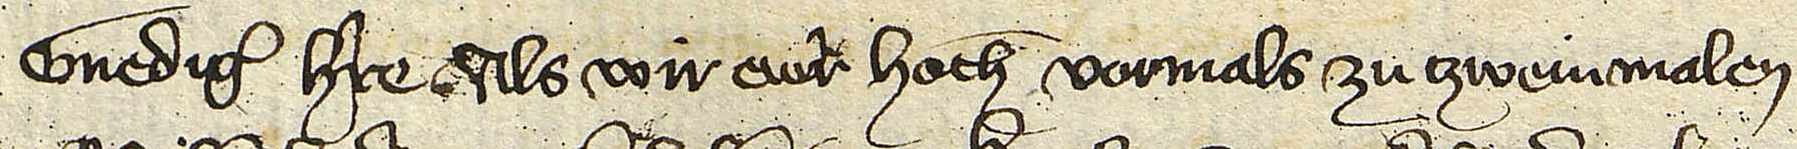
Gnedig* h*re / Als wir ew*r hoch* vormals cʒu cʒweinmalen
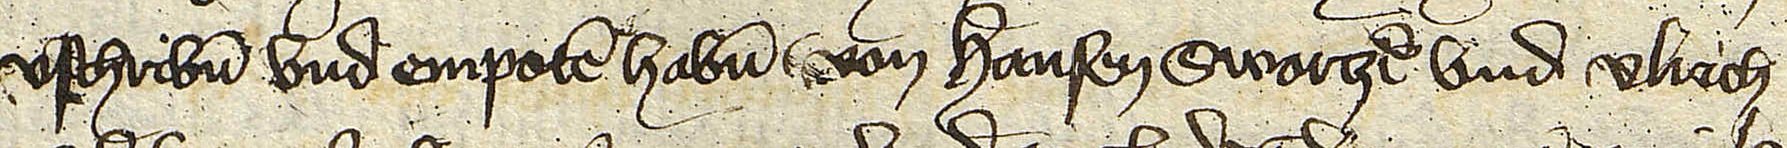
v*ſchribn* vnd empote* habn* / von hanſen Swarcʒe* vnd vlrich
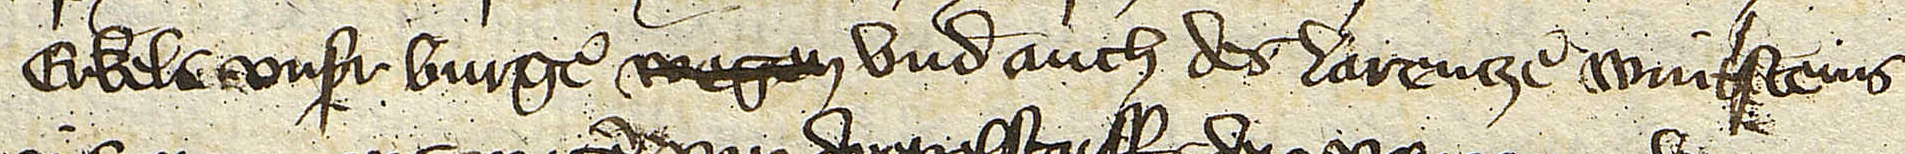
Erkels vnſ*r burge* wegen vnd auch des Larencʒe wintſteins
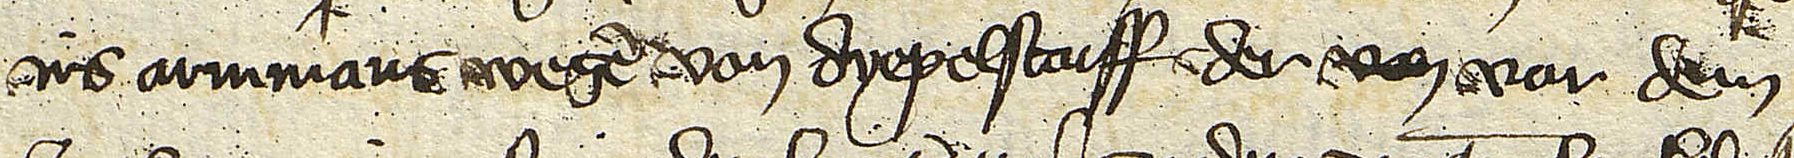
irs armmans wege* von dyepelſtorff / der von vor dem
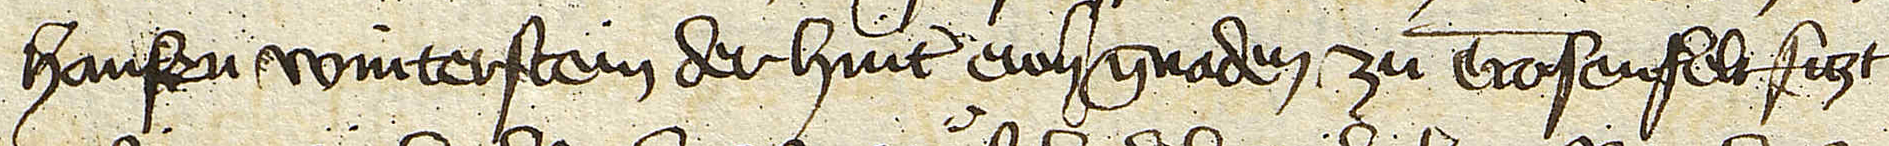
hanſen winterſtein der hint* ewn* gnaden cʒu Troſenfelt ſicʒt
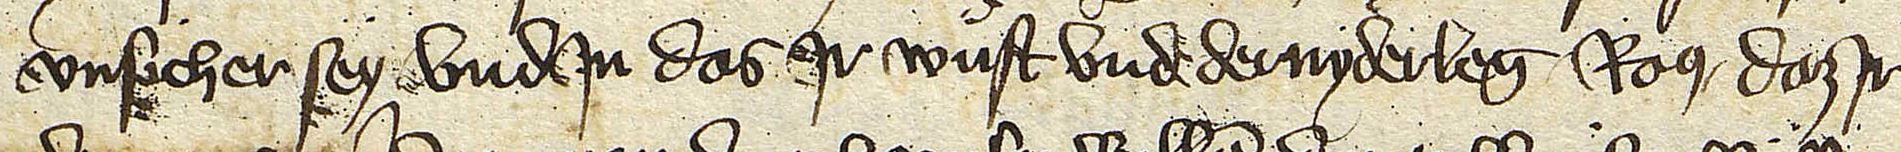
vnſicher ſey / vnd In das Ir wüſt vnd dernyderleg / Ro* / daʒ Ir
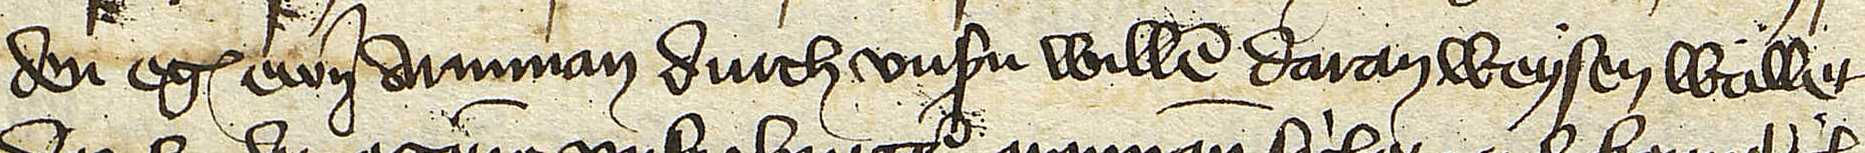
den eg* ewn* Armman durch vnſ*n wille* daran weyſen wöllet
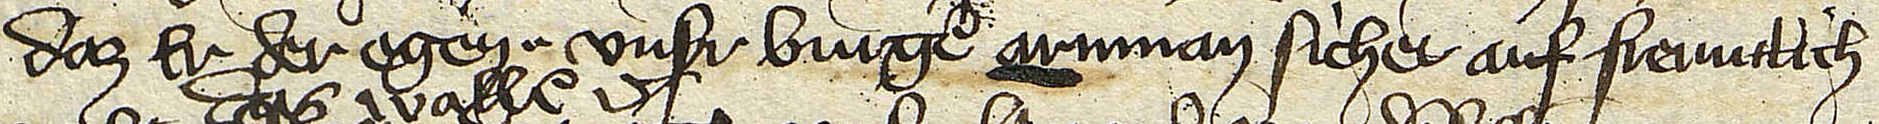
daʒ Er der egen* ~ vnſ*r burge* armman* ſicher auf freuntlich
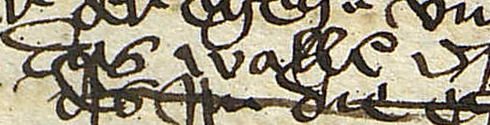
das wolle* ec*
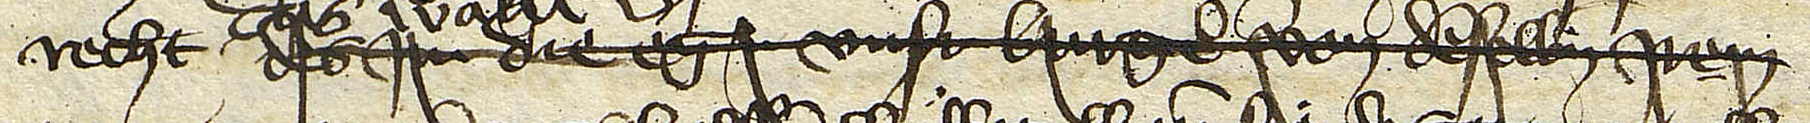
recht des Im die eg* vnſ*r burge* von de*ſelbn* Irem
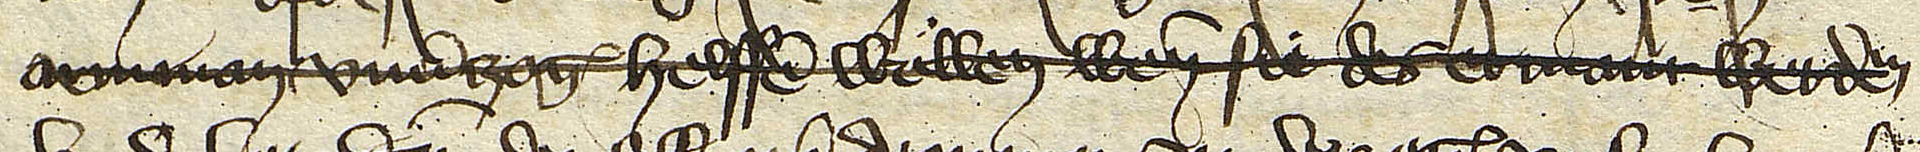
armman / vnu*cʒog* helffe* wöllen wen* ſie des ermant werden
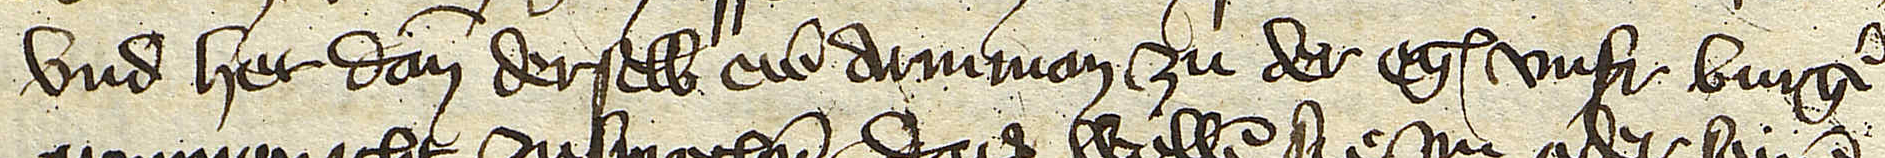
vnd het dan* derſelb ew* Armman cʒu der eg* vnſ*r burge*
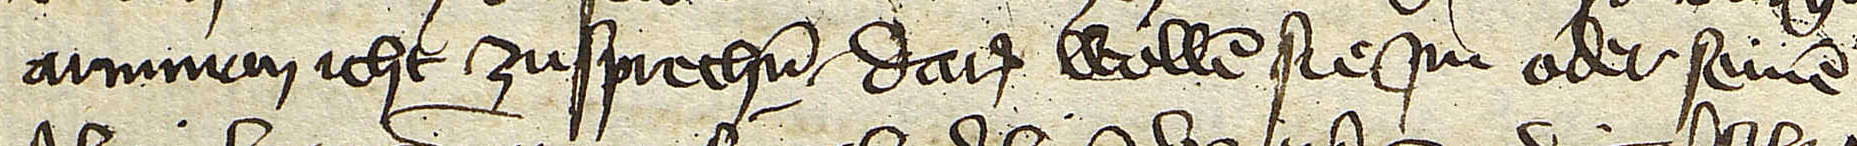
armman icht cʒu ſprechn* / dar* wölle ſie Im oder ſeine*
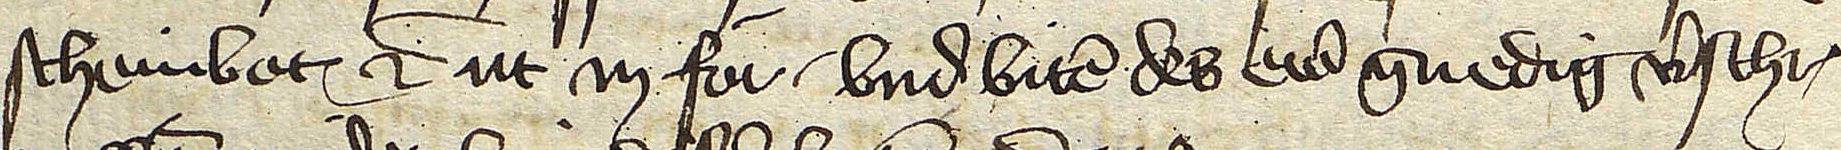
ſcheinbot* ec* ut in for* / vnd bite* des ew* gnedig v*ſchr*
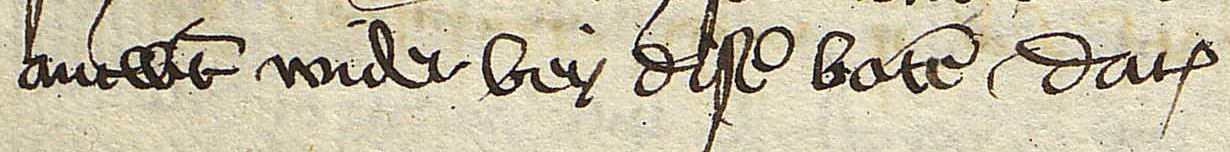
antwt* wider bey diſe* bote* / dat*
